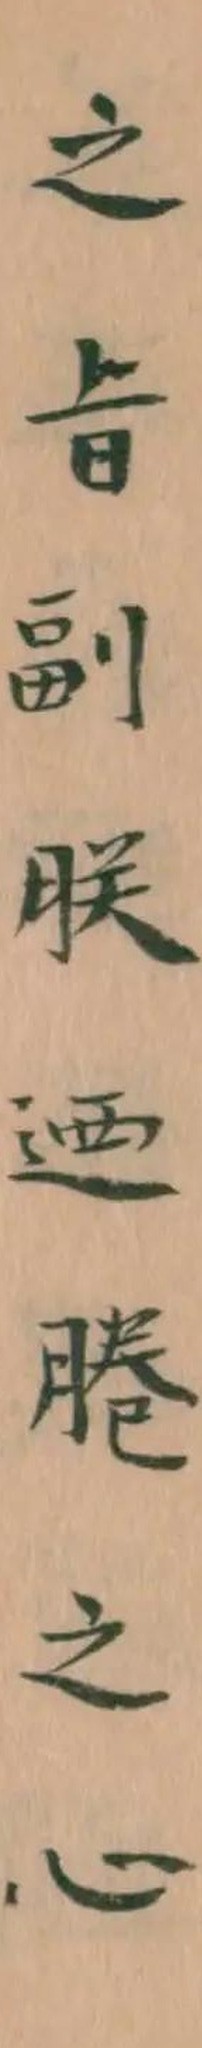之旨副朕迺腃之心
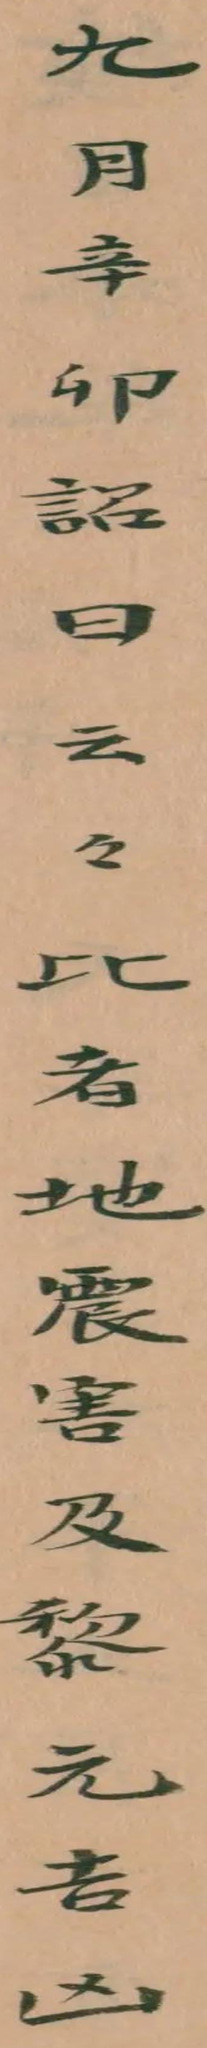九月辛卯詔曰云々比者地震害及黎元吉凶
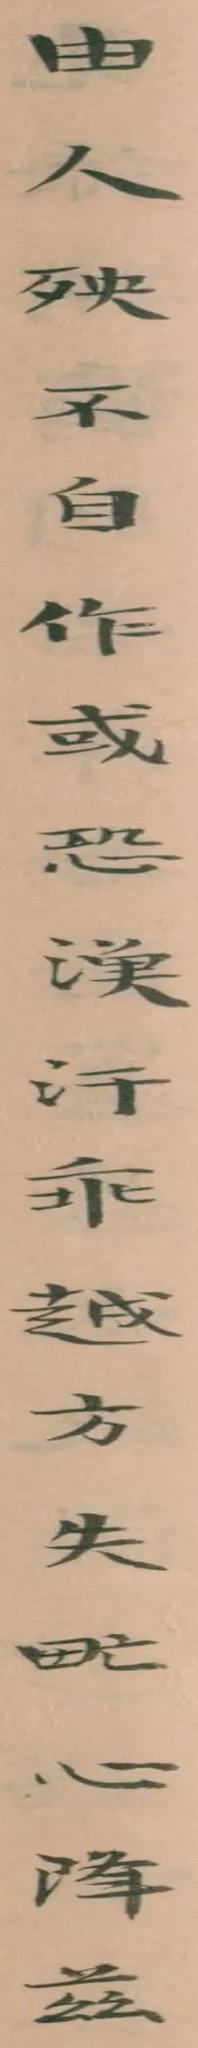由人殃不自作或恐漁汗乖越方失甿心降茲
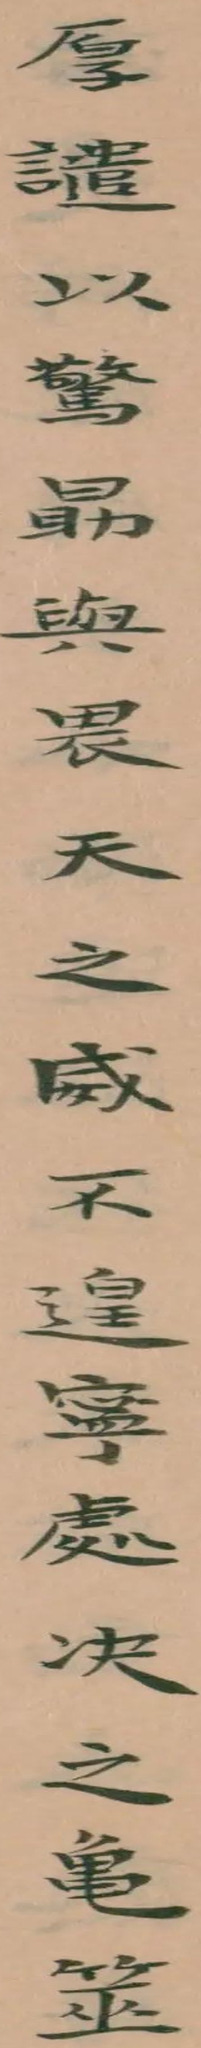厚譴以驚勗與畏天之威不遑寧処決之亀筮
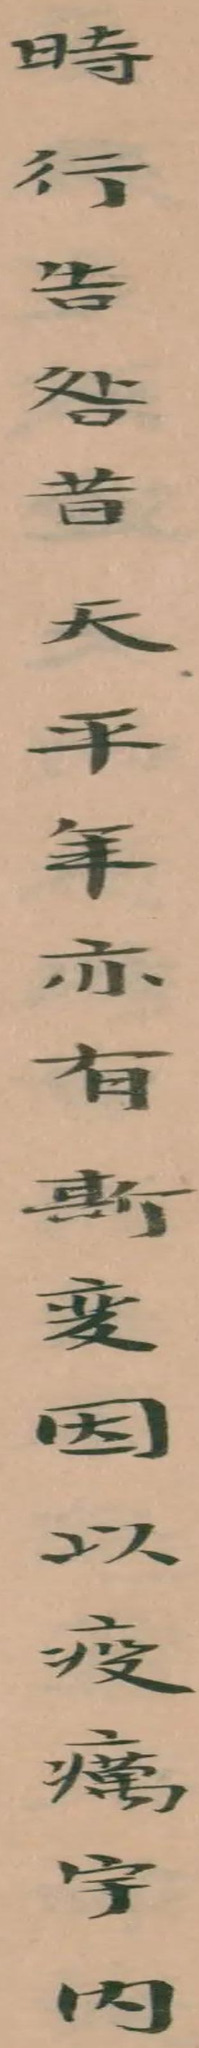時行告咎昔天平年亦有斯変因以疫癘宇内
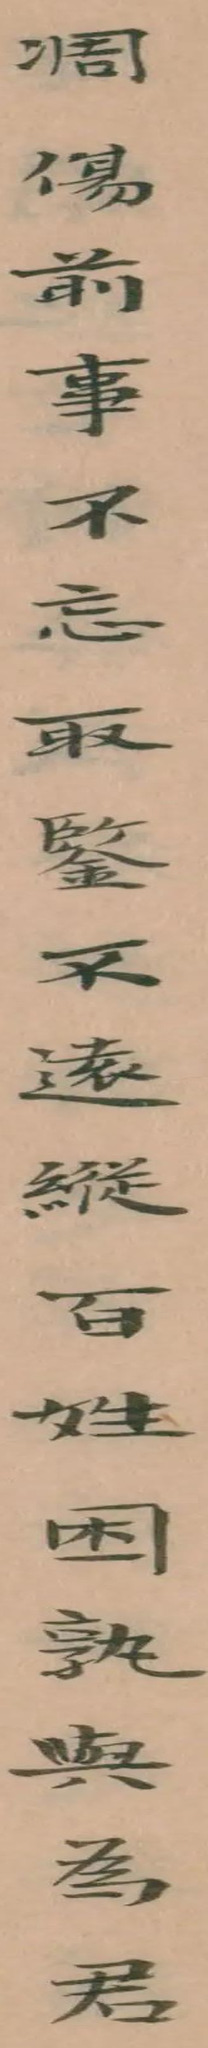凋傷前事不忘取鑑不遠縦百姓困孰與為君
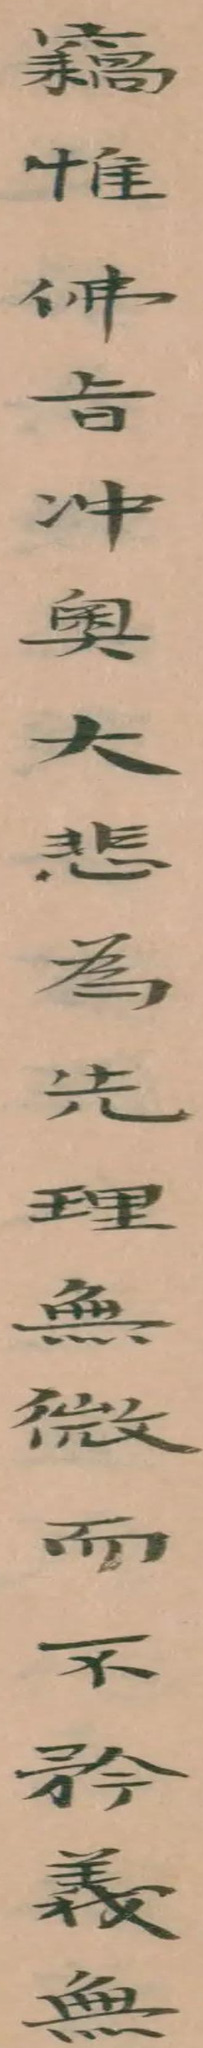竊惟仏旨沖奥大悲為先理武無微而不矜無
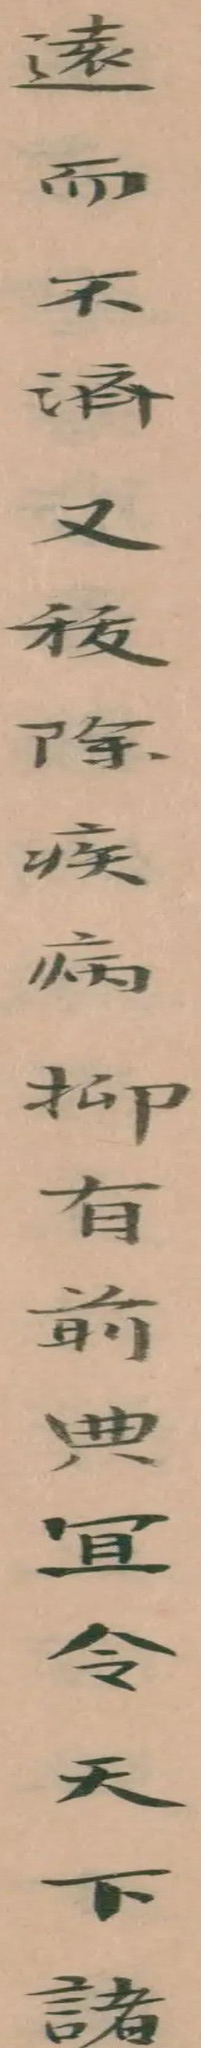遠而不済又祓除疾病抑有前典宜令天下諸
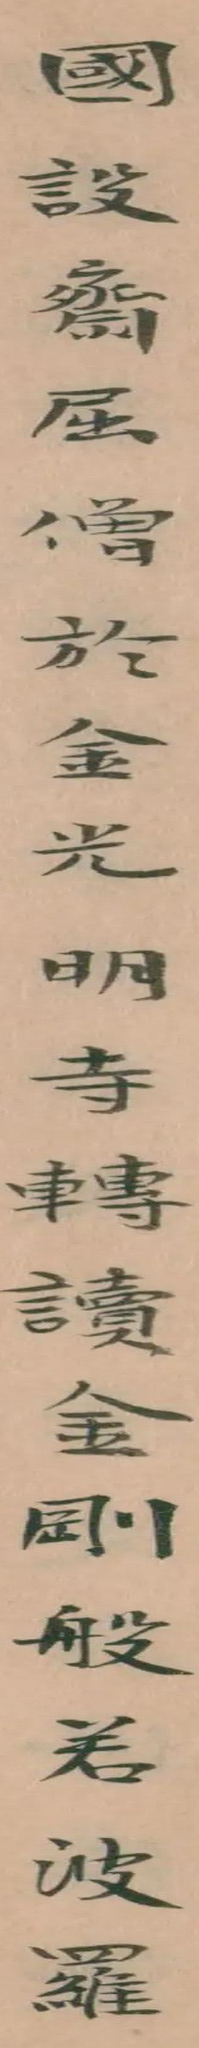国設斉屈僧於金光明寺転読金剛般若波羅
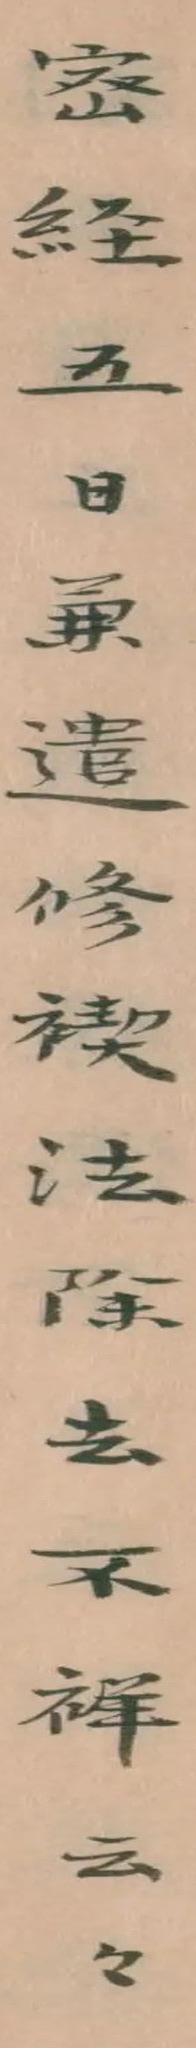密経五日兼遣修禊法除去不祥云々
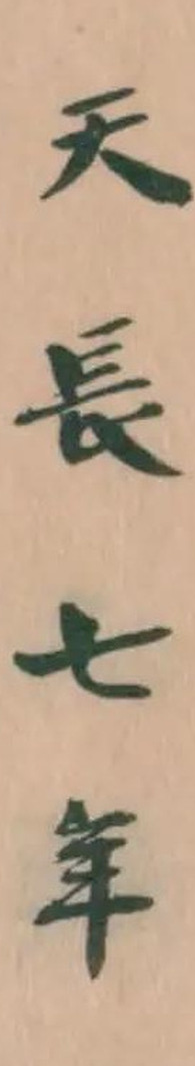天長七年

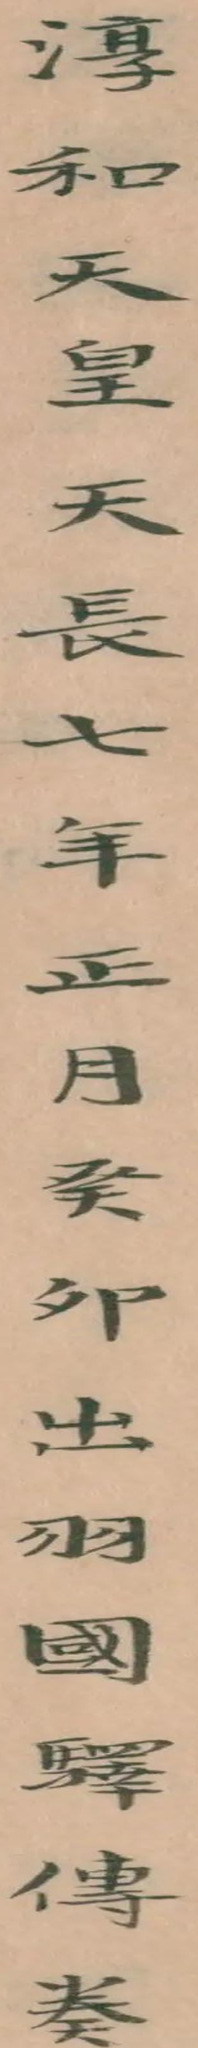淳和天皇天長七年正月癸卯出羽国駅伝奏
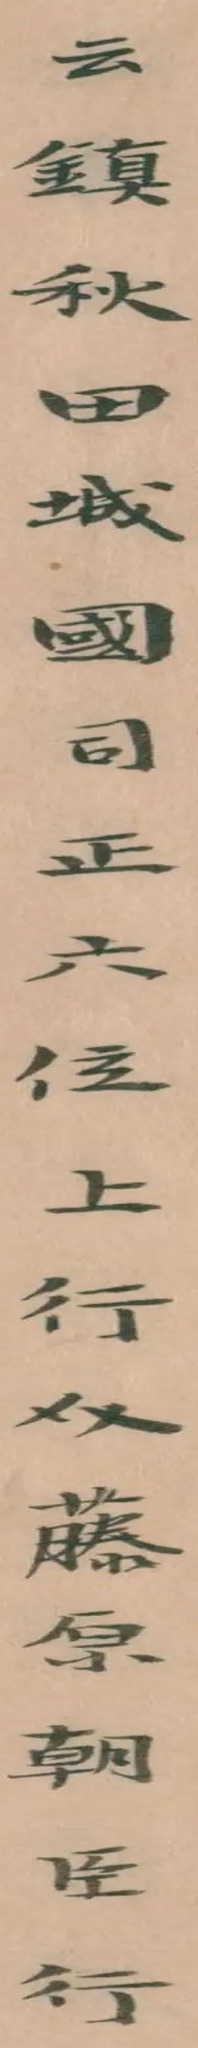云鎮秋田城国司正六位上行介藤原朝臣行
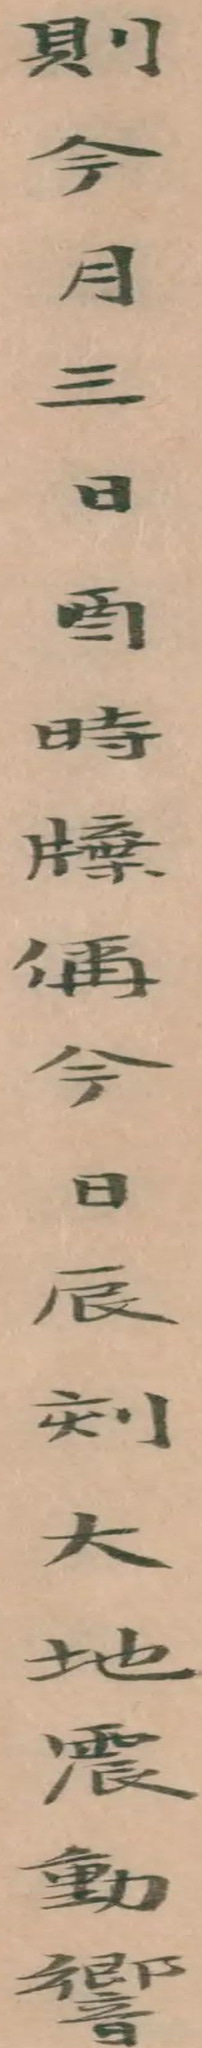則今月三日酉時牒称今日辰刻大地震動響
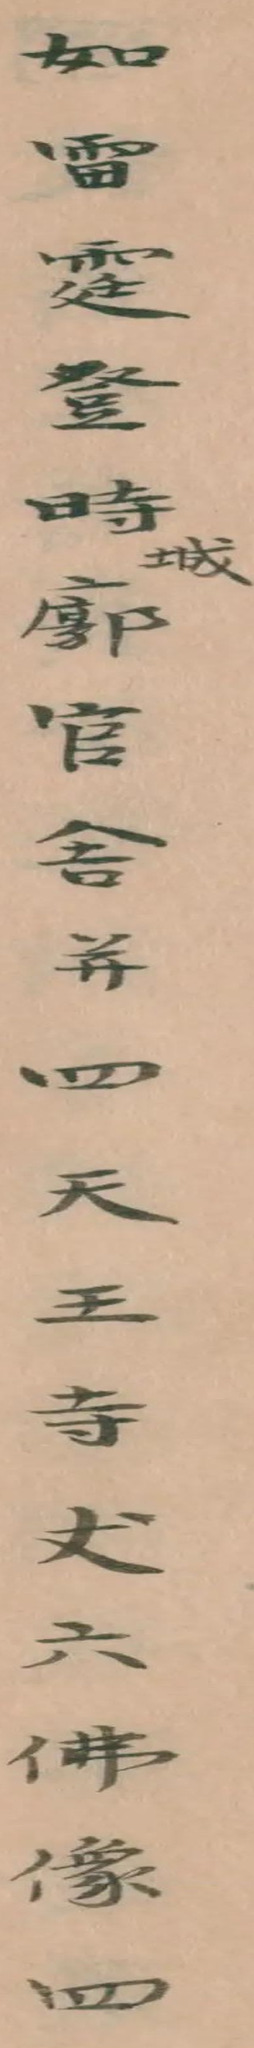如雷霆登時城郭官舎幷四天王寺丈六仏像四
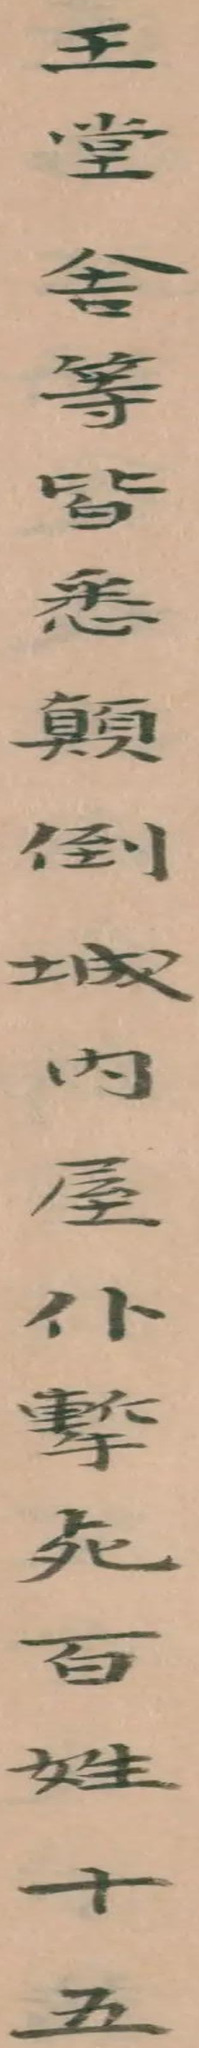王堂舎等皆悉顛倒城内屋仆撃死百姓十五
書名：地災撮要. 巻5-6(地震之部)
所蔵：国立国会図書館 National Diet Library, JAPAN
